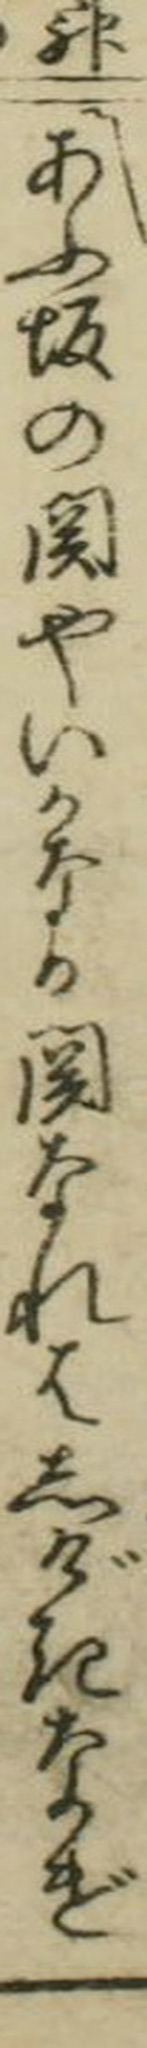〽あふ坂の関やいかなる関なれはしげきなげ
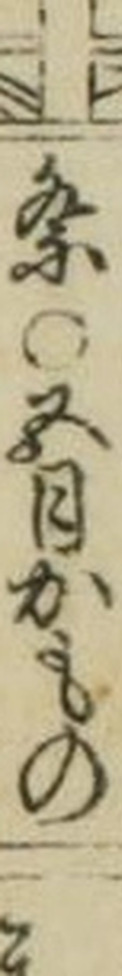祭○五日かもの
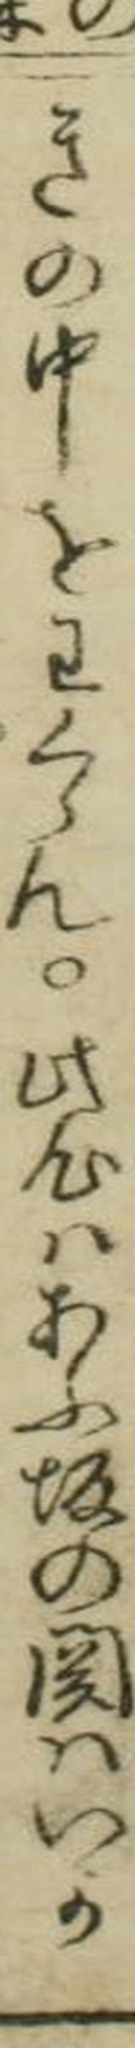きの中をわくらん○此心はあふ坂の関はいか
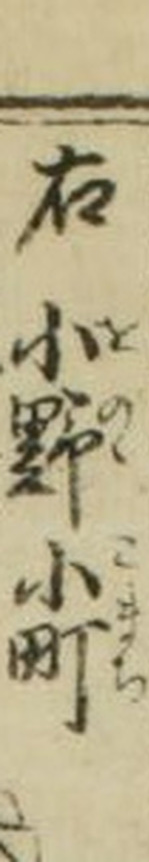右小野小町
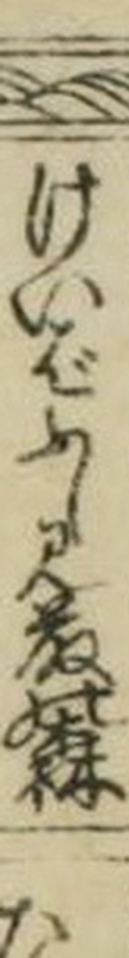けいばふし見藤の森
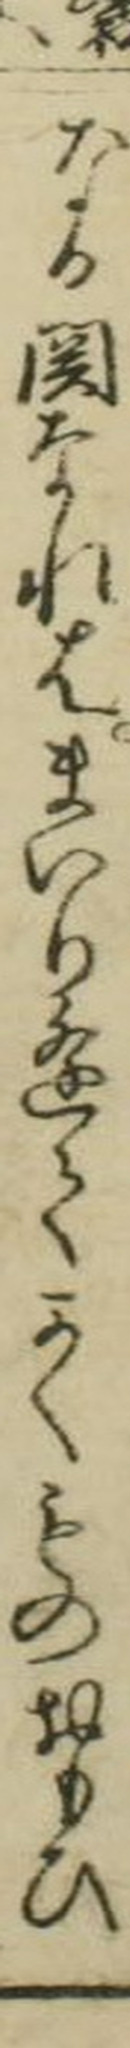なる関なれは。まいり逢てかくものおもひ
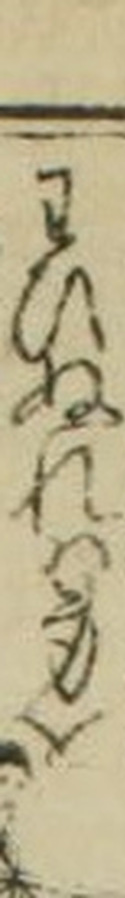わひぬれは身を
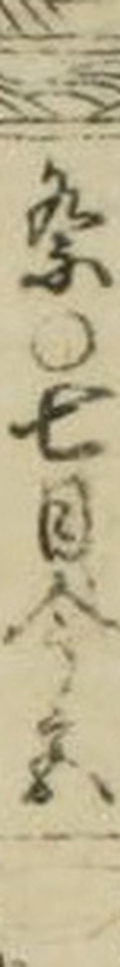祭○七日今宮
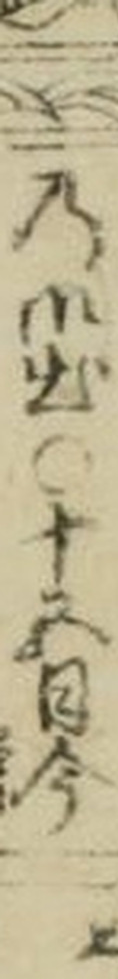の御出○十五日今
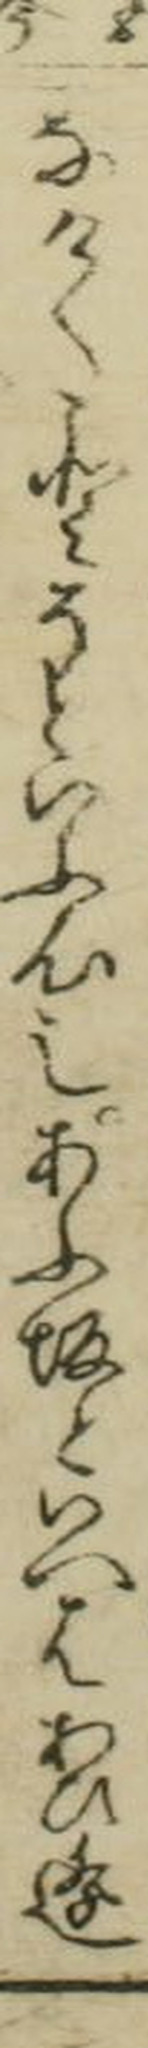なけくことそといふ心也。あふ坂といへはあひ逢
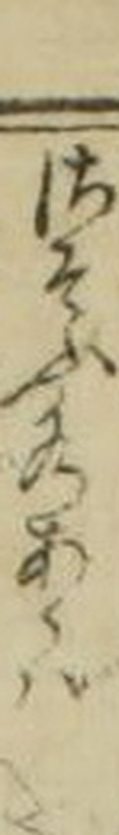さそふ水あらば
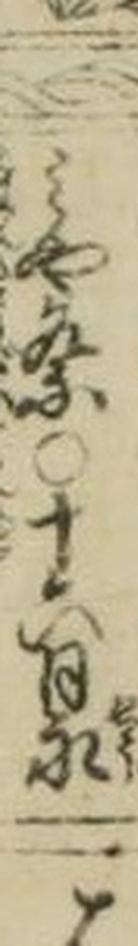みや祭○十六日永
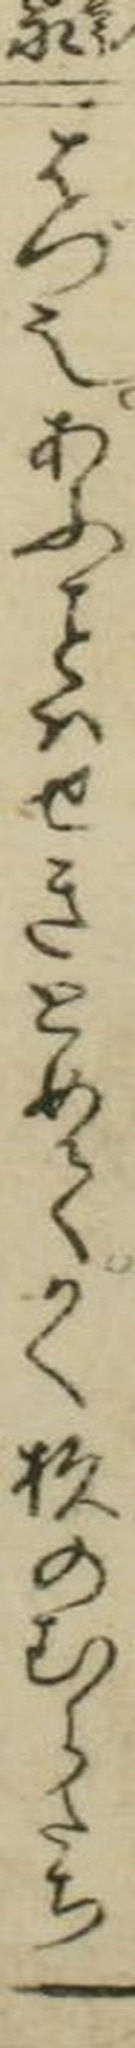はづ也。あふことはせきとめて。かく杉のむらたち
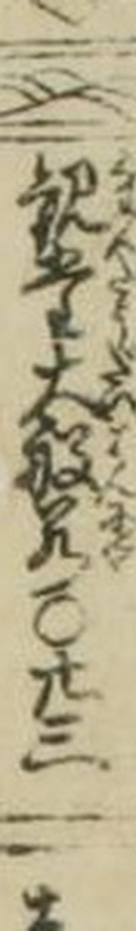観堂大般若○廿三
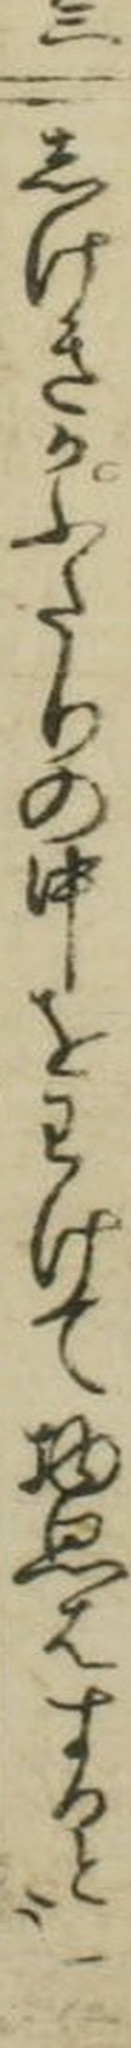しけきか。ふたりの中をわけて物思はすると也
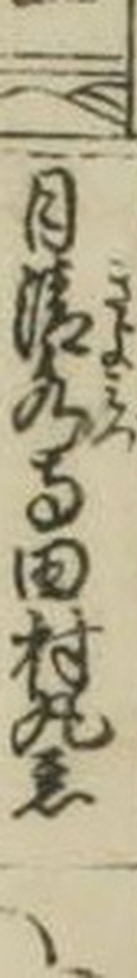日清水寺田村丸ゑ
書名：女源氏教訓鑑
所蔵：東京学芸大学附属図書館
